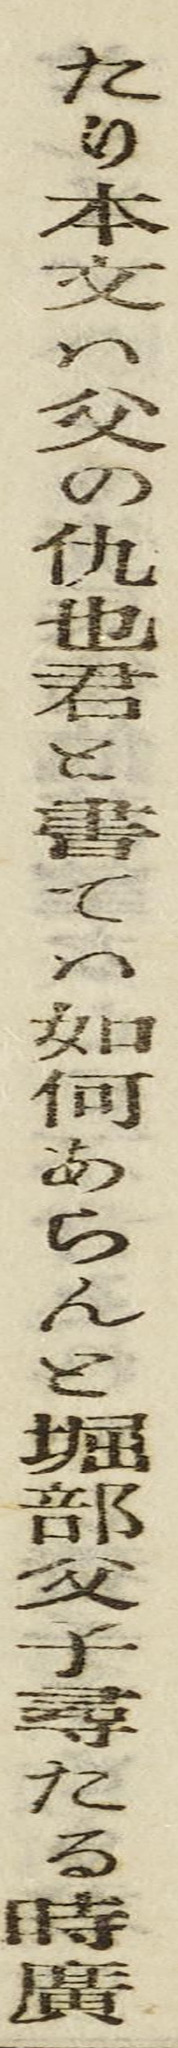たり本文ハ父の仇也君と書てハ如何あらんと堀部父子尋たる時広
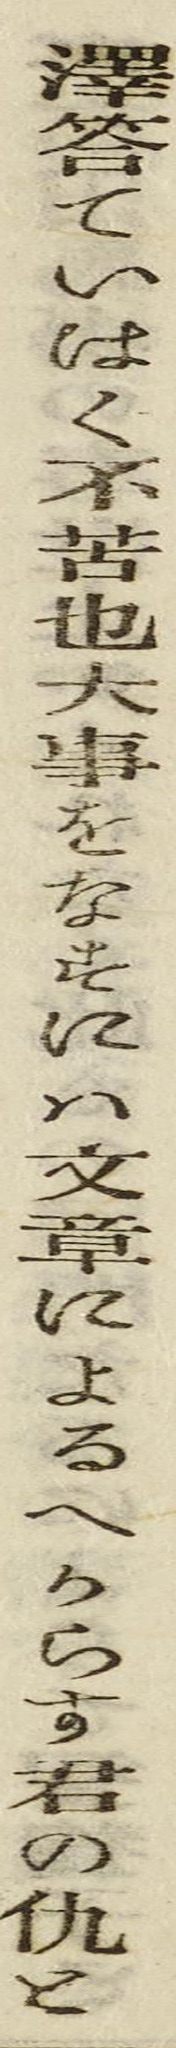沢答ていはく不苦也大事をなすにハ文章によるへからす君の仇と
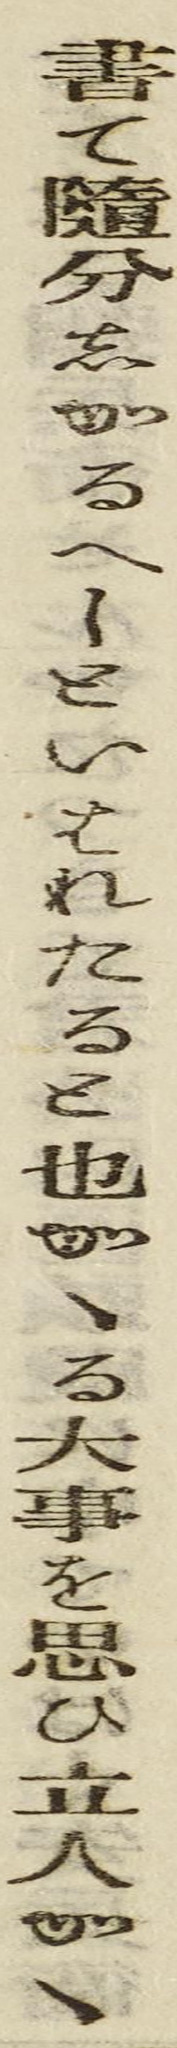書て随分しかるへしといはれたると也かゝる大事を思ひ立人かゝ
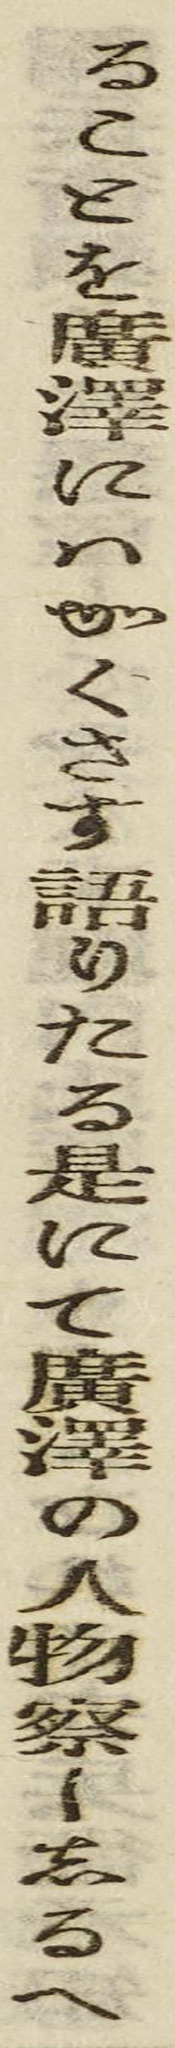ることを広沢にハかくさす語りたる是にて広沢の人物察ししるへ
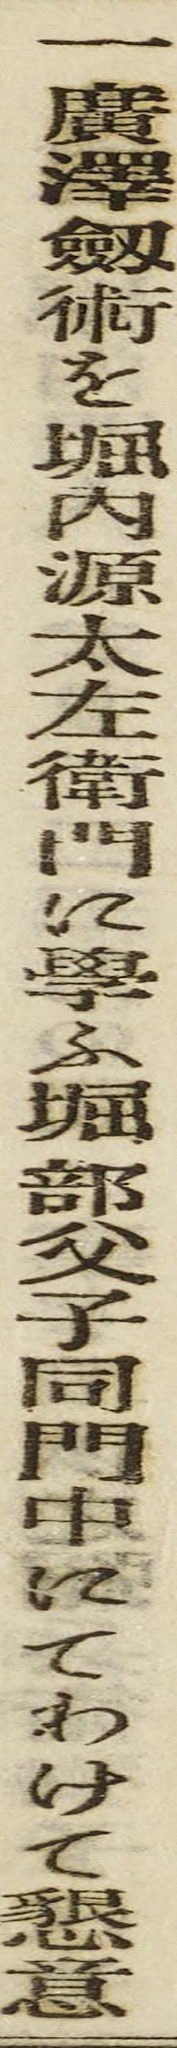一広沢剣術と堀内源太左衛門に学ふ堀部父子同門中にてわけて懇意
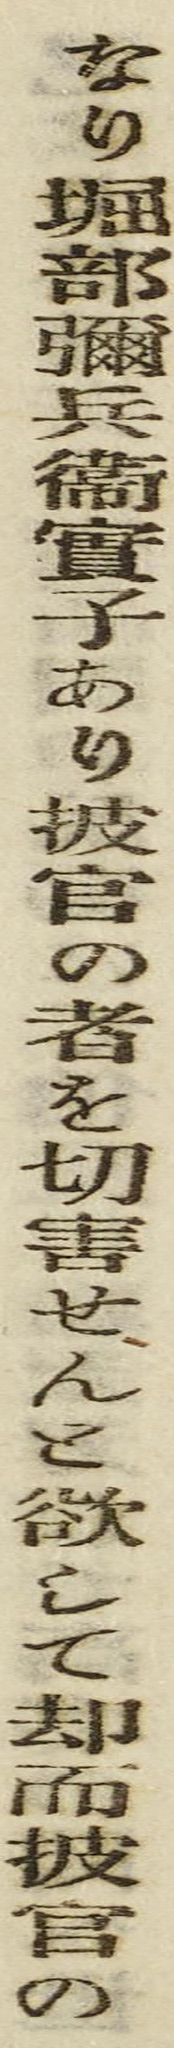なり堀部弥兵衛実子あり披官の者を切害せんと欲して却而披官の
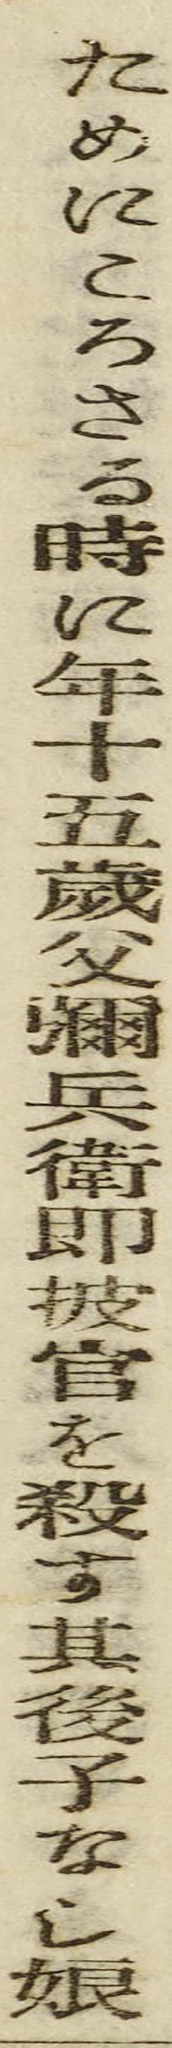ためにころさる時に年十五歳父弥兵衛即披官を殺す其後子なし娘

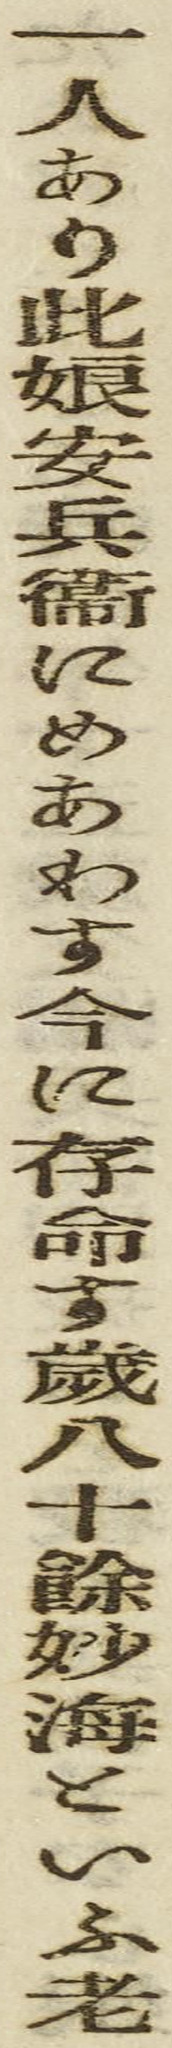一人あり此娘安兵衛にめあわす今に存命す歳八十余妙海といふ老
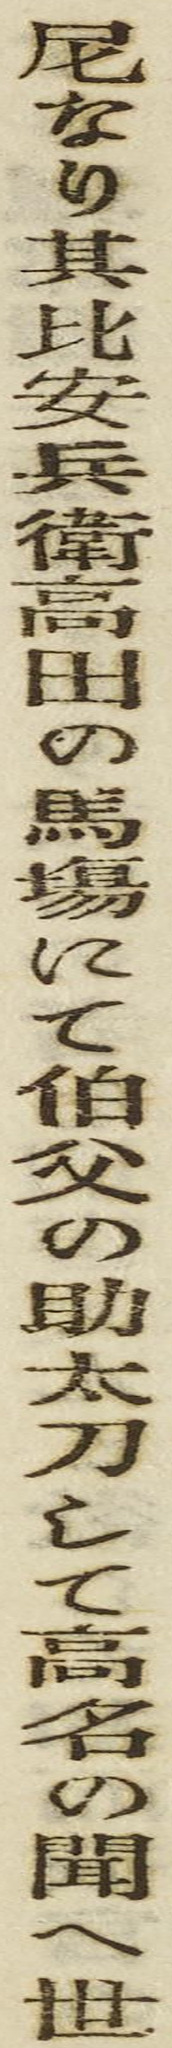尼なり其此安兵衛高田の馬場にて伯父の助太刀して高名の聞へ世
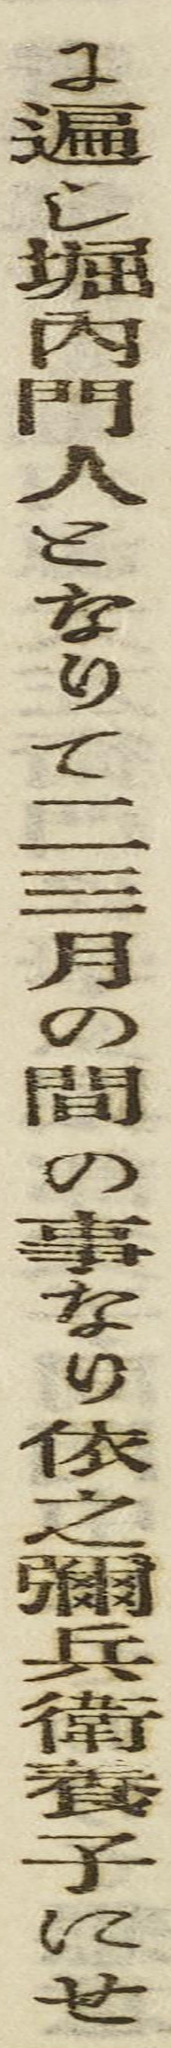に遍し堀内門人となりて二三月の間の事なり依之弥兵衛養子にせ
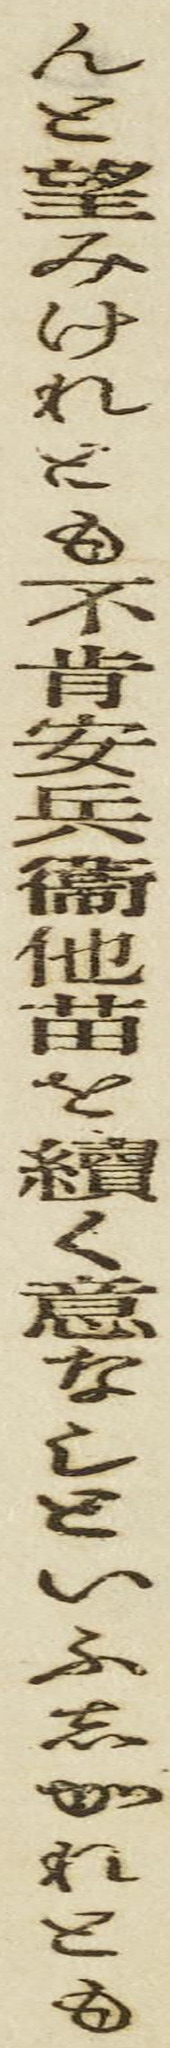んと望みけれとも不肯安兵衛他苗を続く意なしといふしかれとも
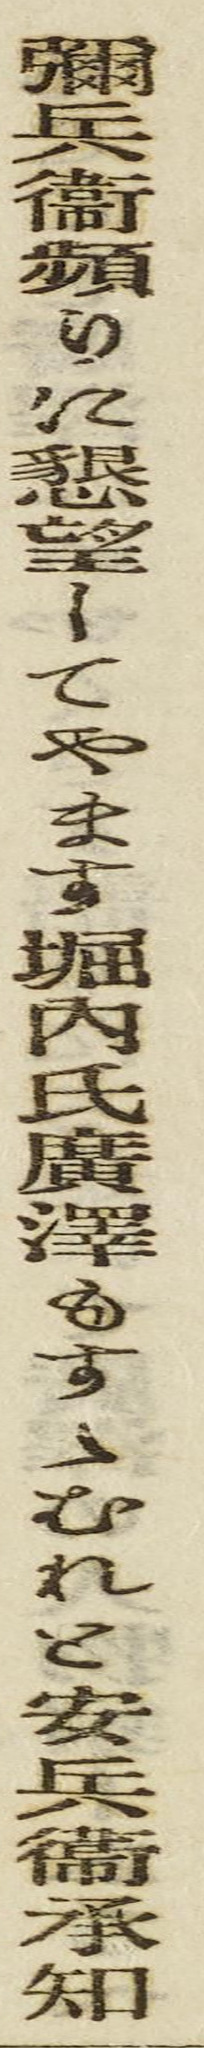弥兵衛頻りに懇望してやます堀内氏広沢もすゝむれと安兵衛承知
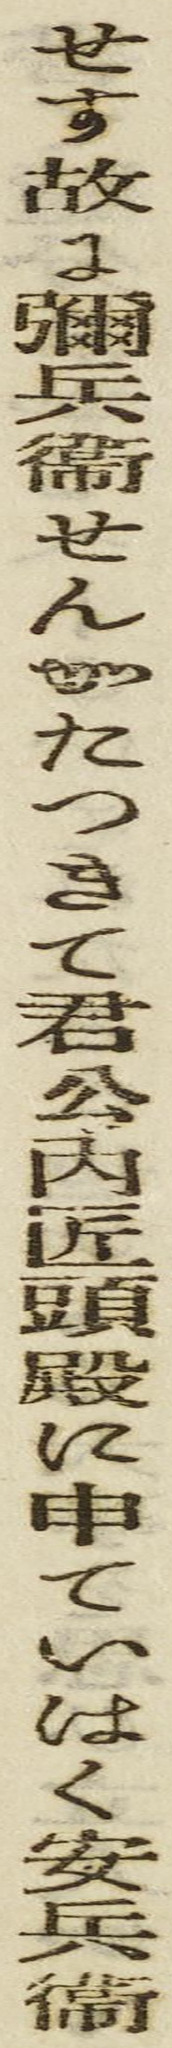せす故に弥兵衛せんかたつきて君公内匠頭殿に申ていはく安兵衛
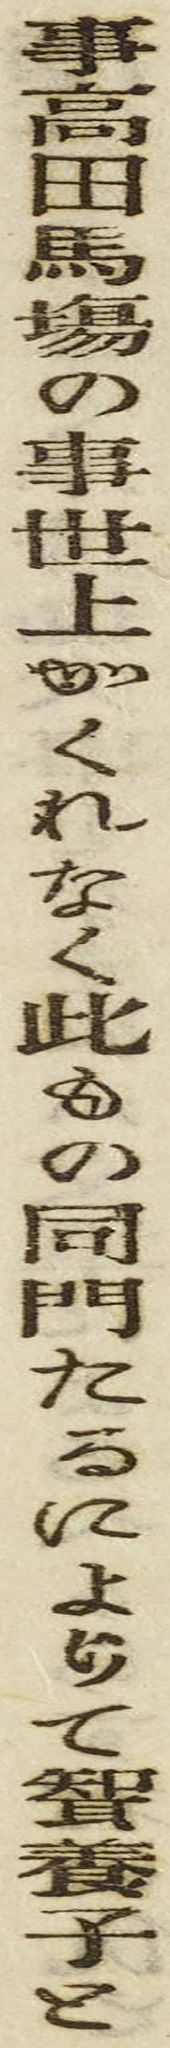事高田馬場の事世上かくれなく此もの同門たるによりて聟養子と
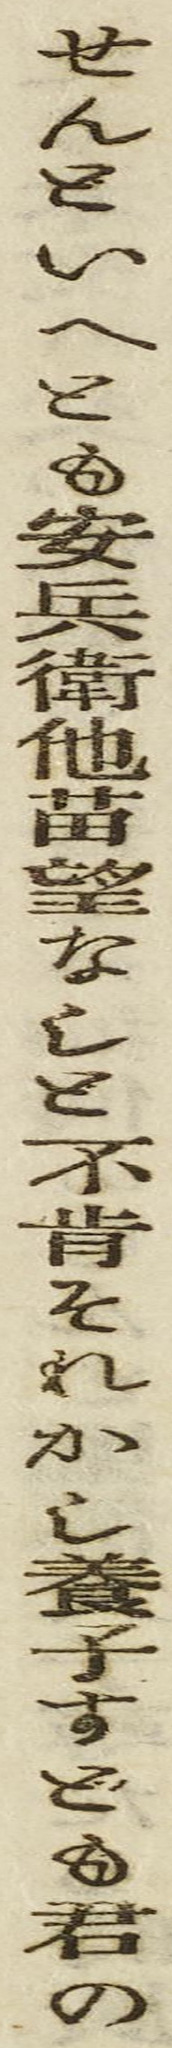せんといへとも安兵衛他苗望なしと不肯それかし養子すとも君の
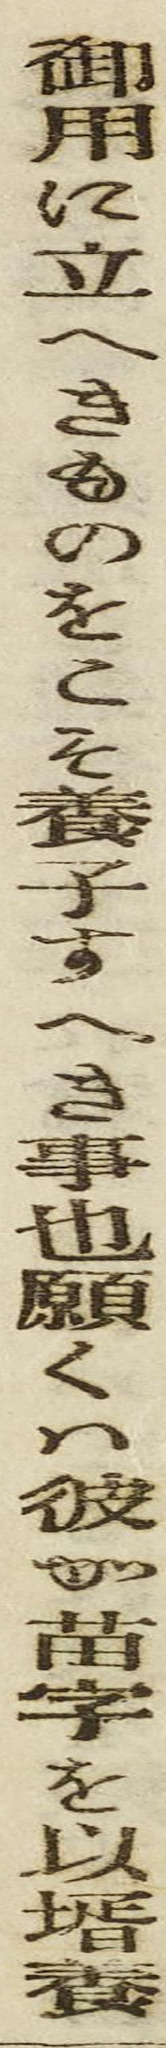御用に立へきものをこそ養子すへき事也願くハ彼か苗字を以壻養
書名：史籍集覽　朝鮮陣古文・細井廣澤記・颶風紀事・天明七年將軍宣下次第書　全
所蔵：東京大学地震研究所図書室 Earthquake Research Institute Library, The University of Tokyo, JAPAN
